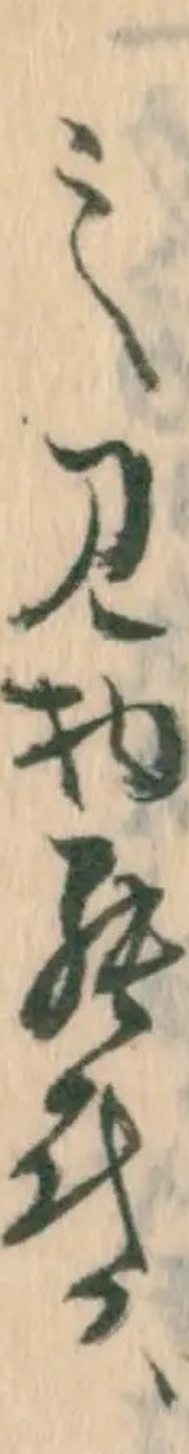之見物罷越ス
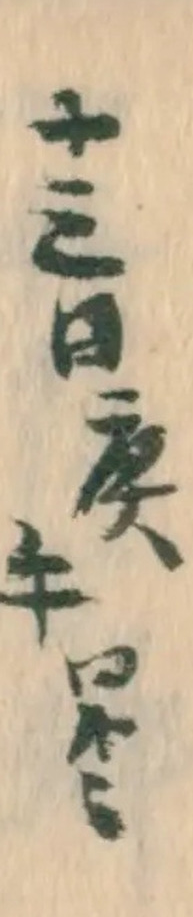十三日庚午曇
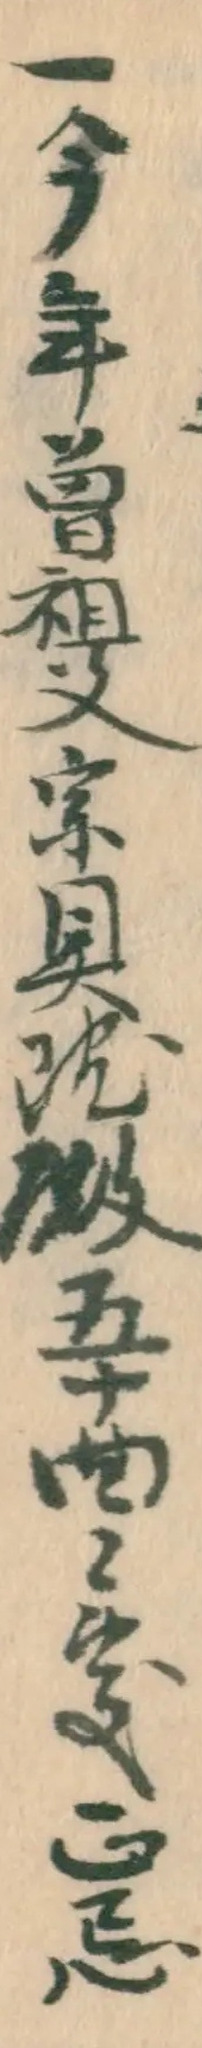一今年曾祖父宗具院殿五十回候処正忌
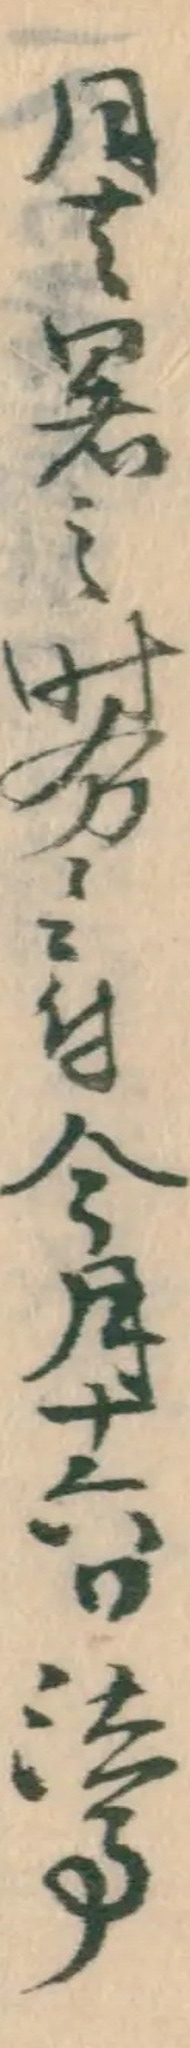月は暑之時分候ニ付今月十六日法事
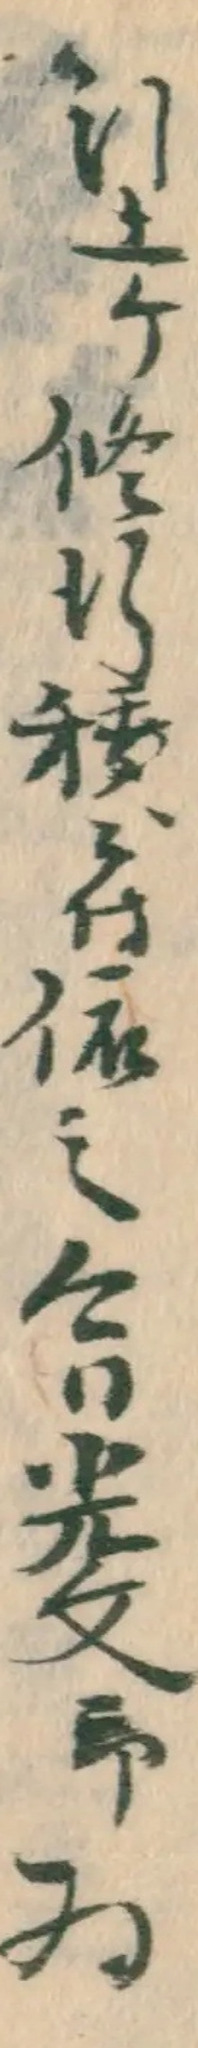引上ケ修行積ニ付依之今日光文予為
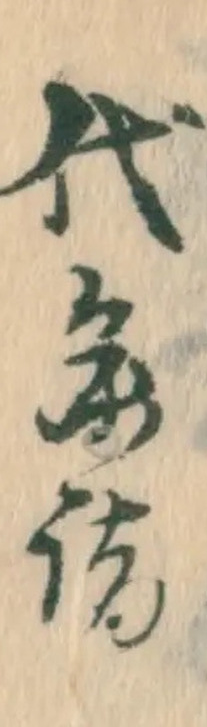代参詣
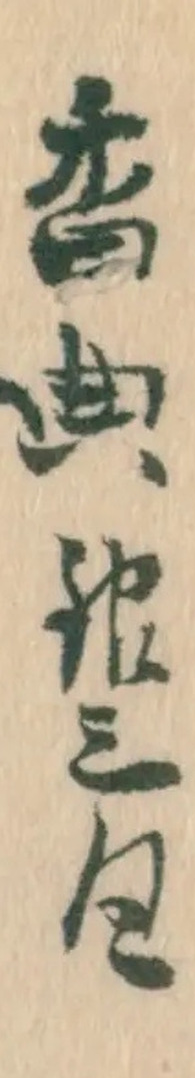香典銀三匁
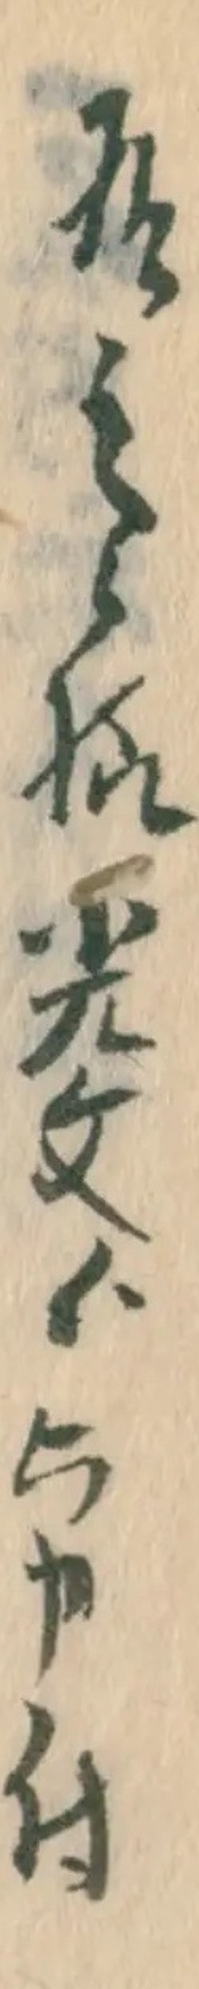有之候様光文ゟ被申付
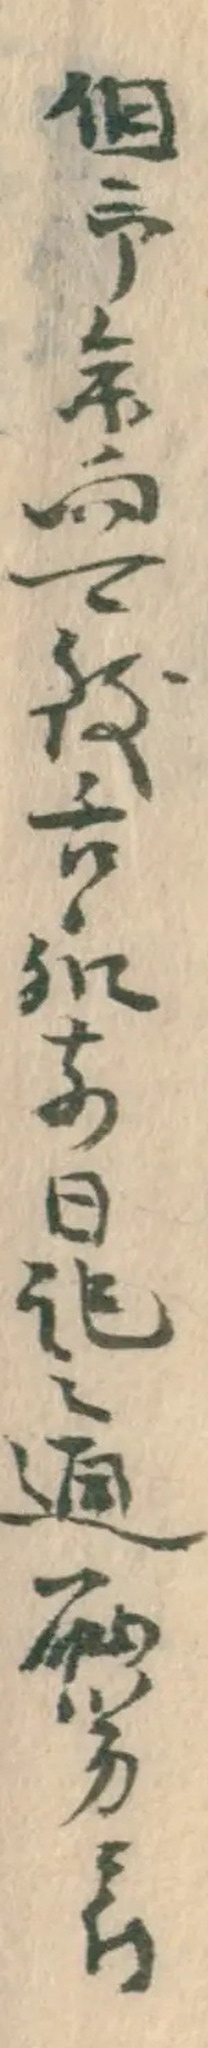但予参向可致筈候処前日記之通所労ニ付
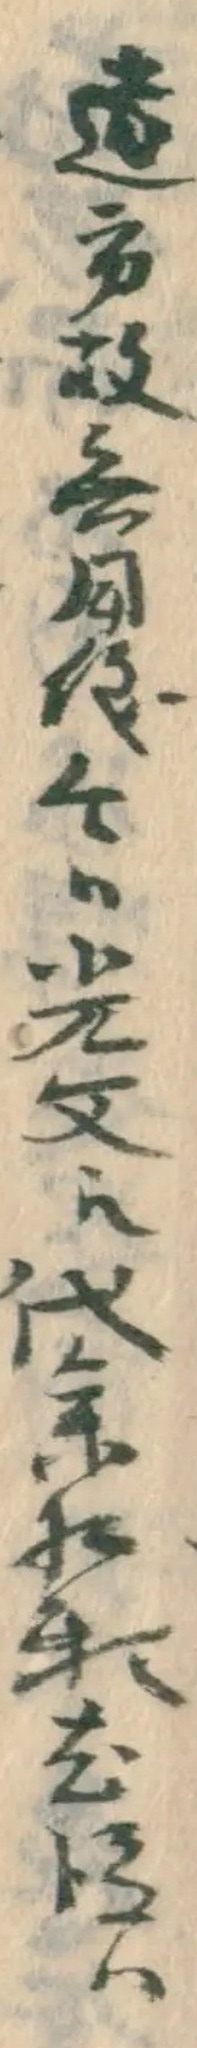遠方故無余儀今日光文え代参相頼尤後ハ
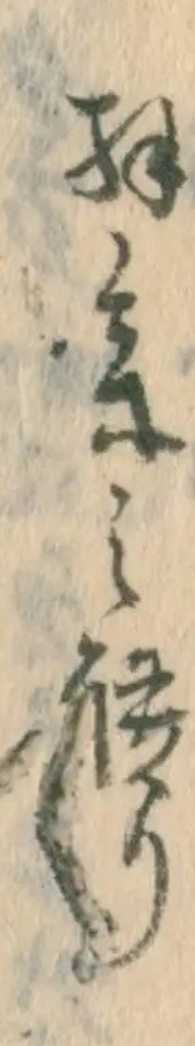拝参之積り

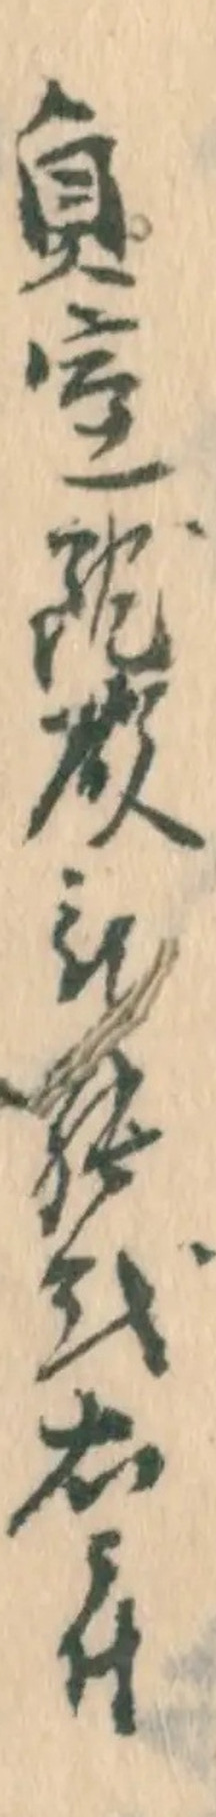貞室院殿被罷越右ニ付
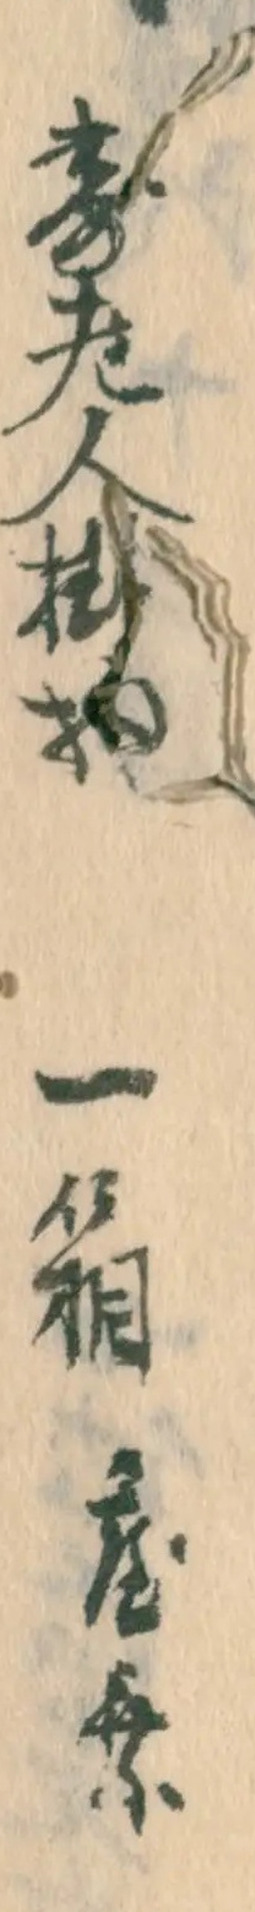寿老人掛物一箱台乗
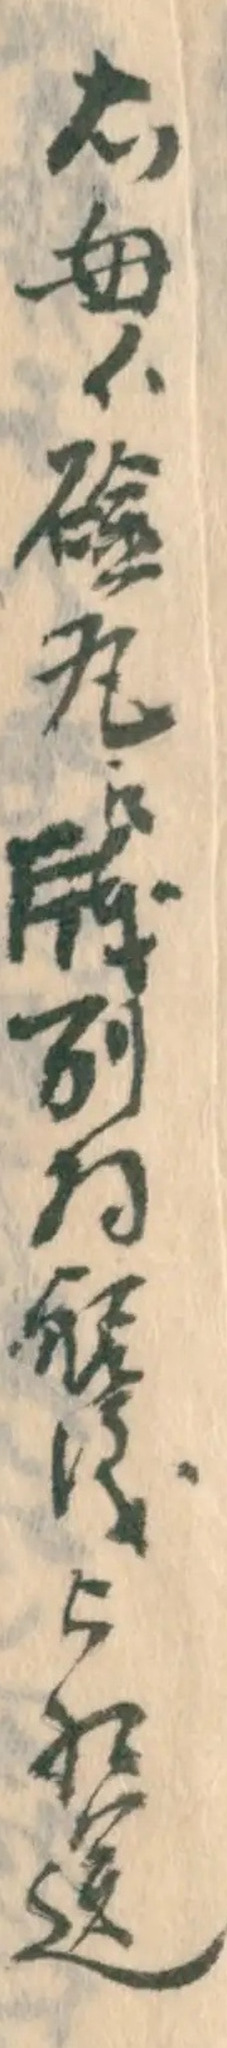右母ゟ碒丸え牋別為祝儀被相運
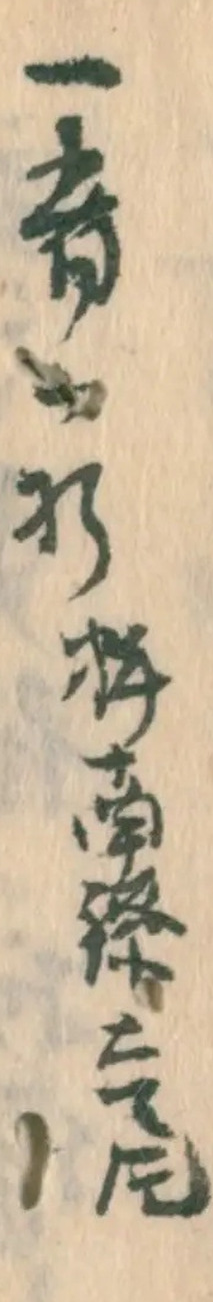一肴一折料南鐐壱片
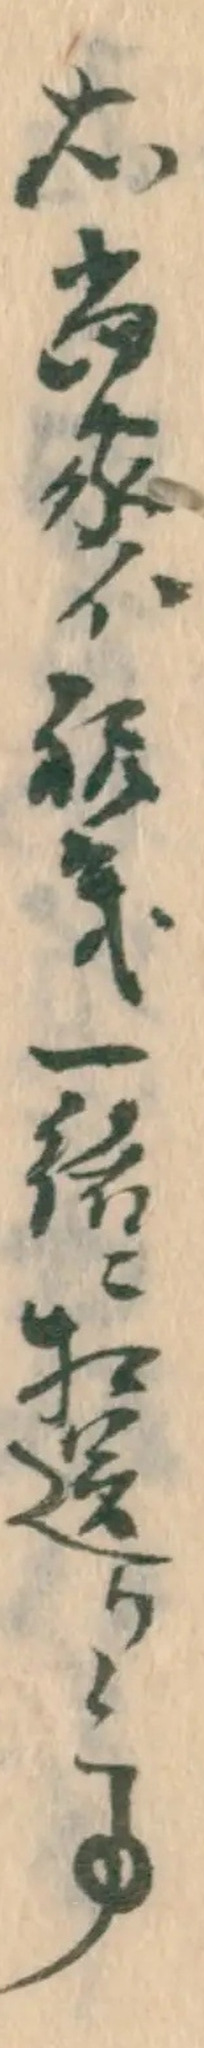右当家ゟ祝義一緒ニ相送り候事
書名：禁裏御所御用日記. [131]
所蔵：国立国会図書館 National Diet Library, JAPAN
